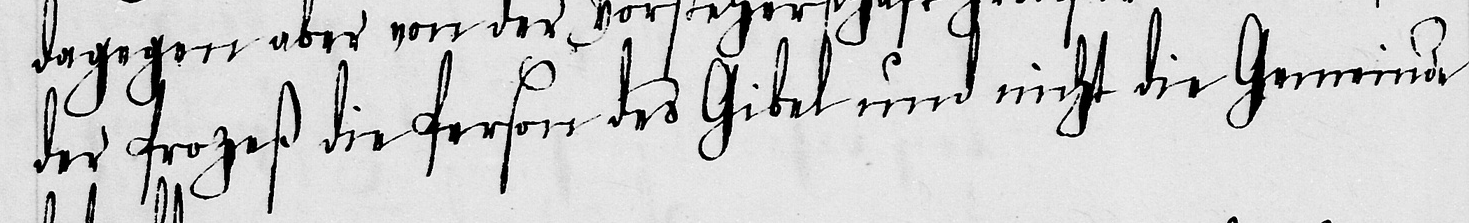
der Prozeß die Person des Gibel und nicht die Gemeinde
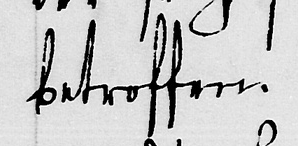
betroffe¬
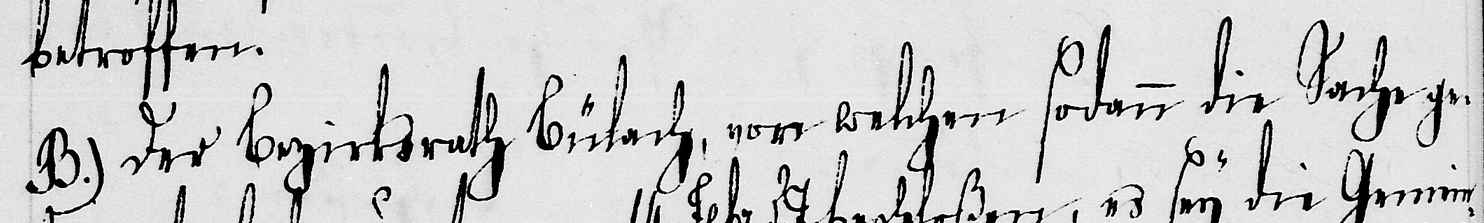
B.) Der Bezirksrath Bülach, von welchen sodann die Sache ge¬
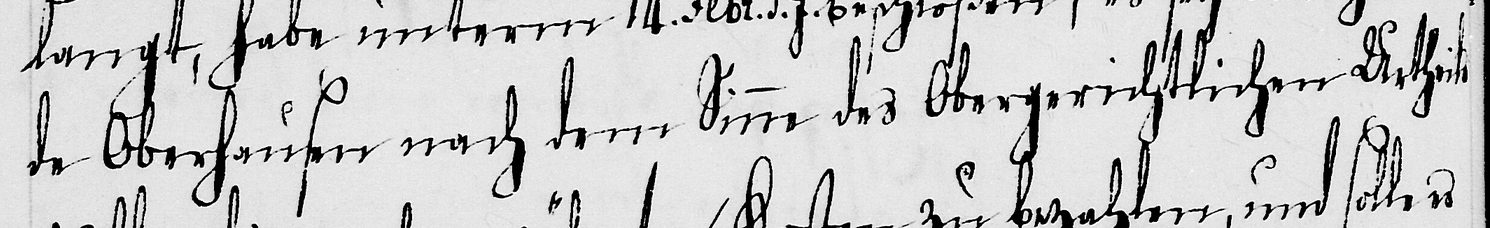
nde Oberhausen nach dem Sinne des Obergerichtlichen Urthe¬
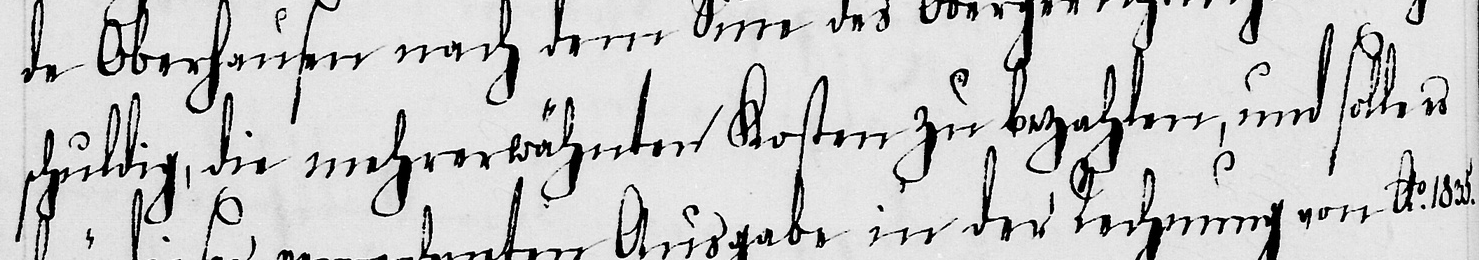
schuldig, die mehrerwähnten Kosten zu bezahlen, und solle
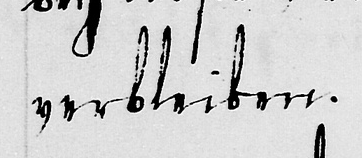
verbleiben
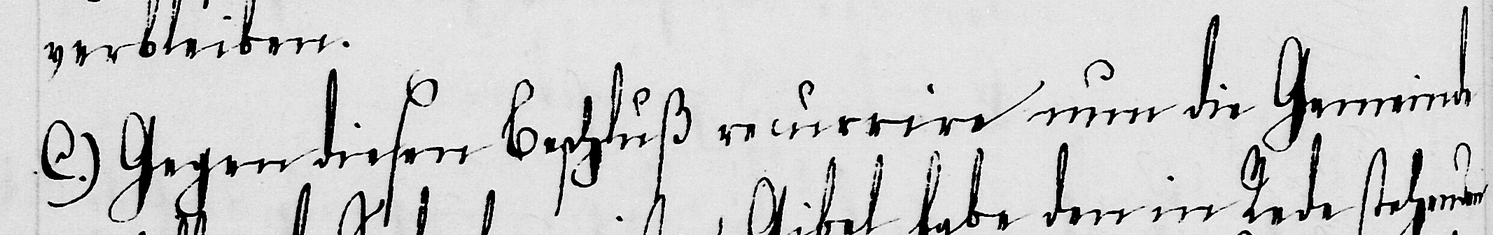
C.) Gegen diesen Beschluß recurrire nun die Gemeinde
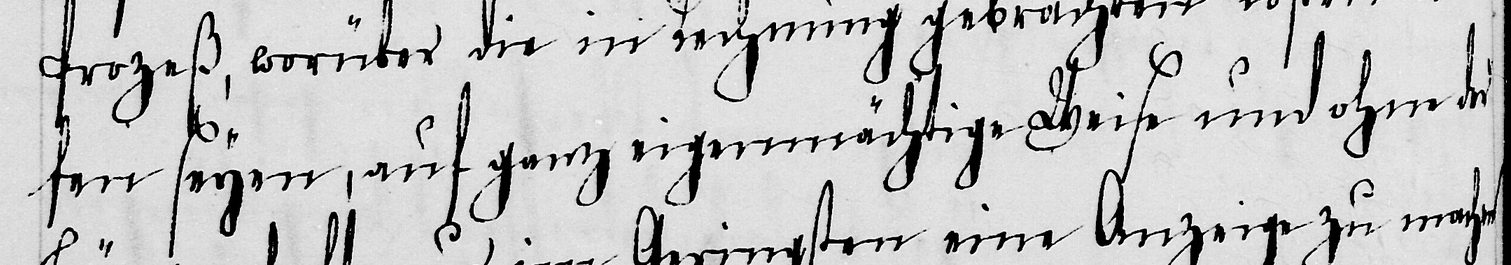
ufen seyen, auf ganz eigenmächtige Weise und ohne der
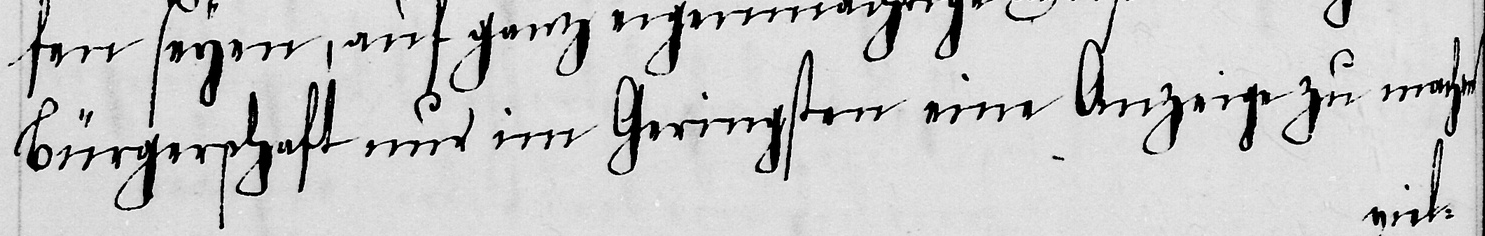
Bürgerschaft nur im Geringsten eine Anzeige zu mach¬
